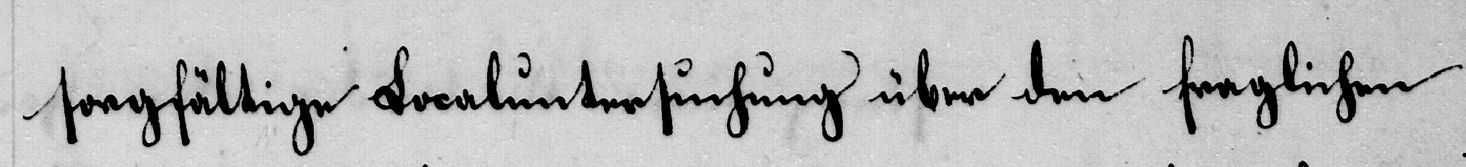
sorgfältige Localbesichtigung über den fraglichen
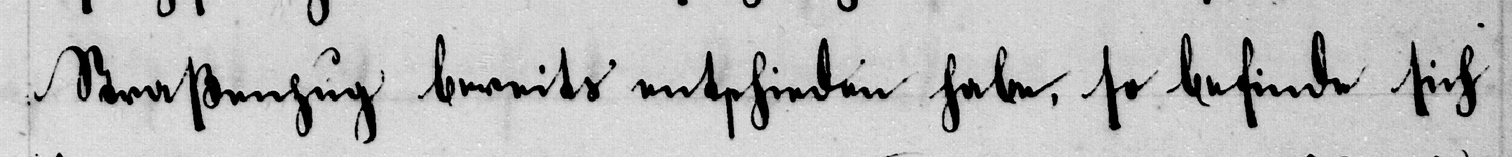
Straßenzug bereits entschieden habe, so befinde sich
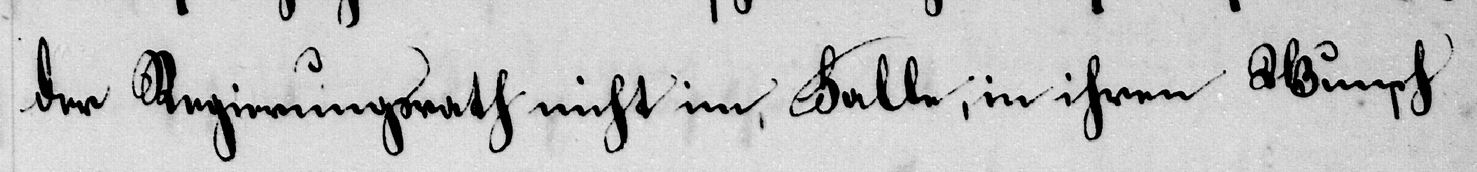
der Regierungsrath nicht im Falle, in ihren Wunsch
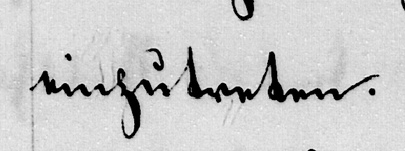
einzutreten.
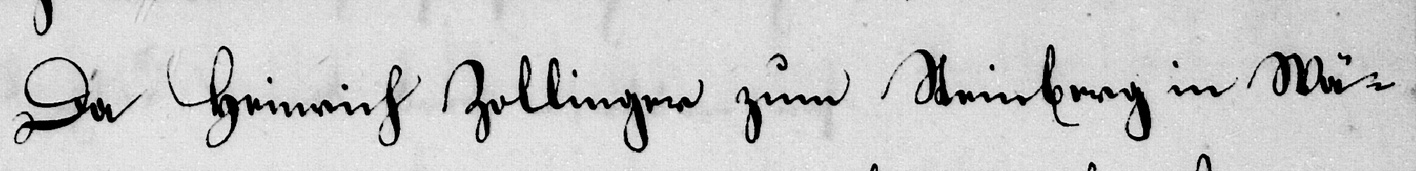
Da Heinrich Zollinger zum Steinberg in Wä¬
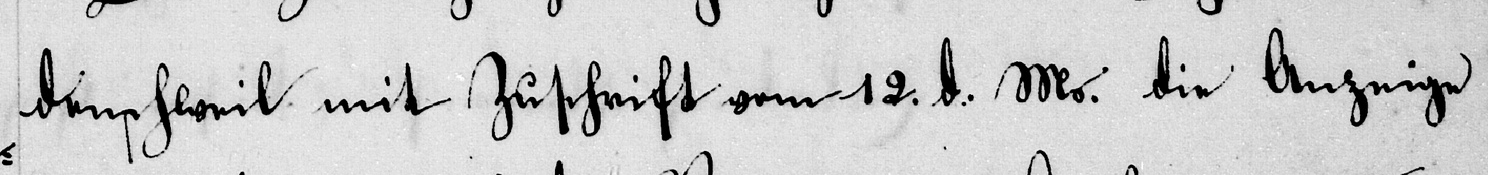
denschweil mit Zuschrift vom 21. d. Ms. die Anzeige
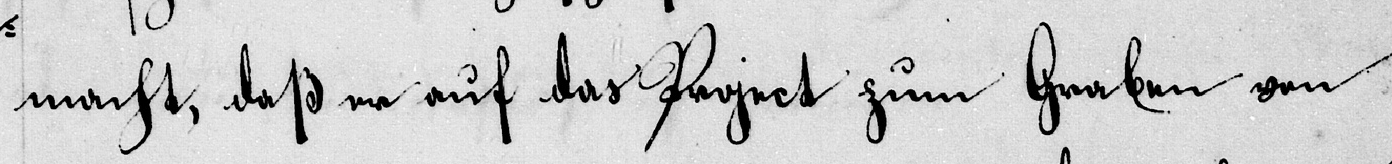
macht, daß er auf das Project zum Graben von
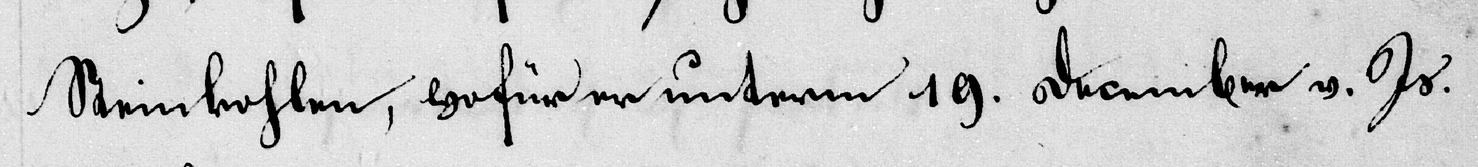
Steinkohlen, wofür er unterm 19. December v. Js.
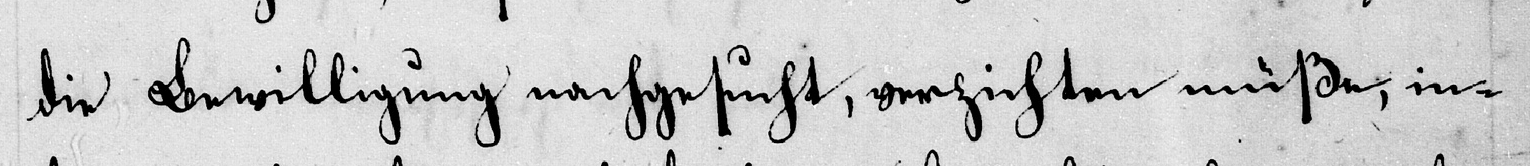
die Bewilligung nachgesucht, verzichten müße, in¬
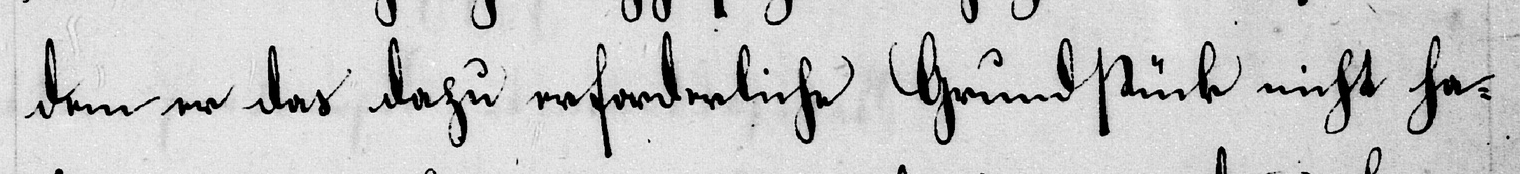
dem er das dazu erforderliche Grundstück nicht ha¬
